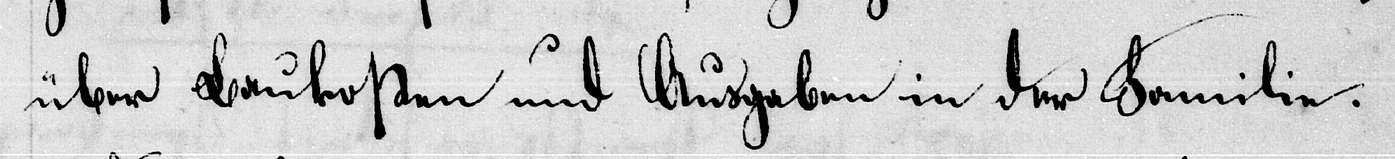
über Baukosten und Ausgaben in der Familie.
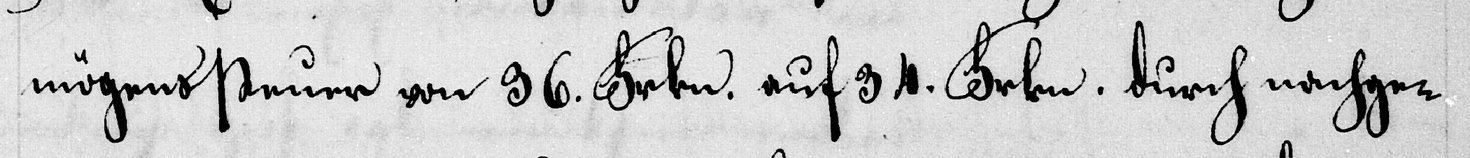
mögenssteuer von 36. Frkn. auf 34. Frkn. durch nachge¬
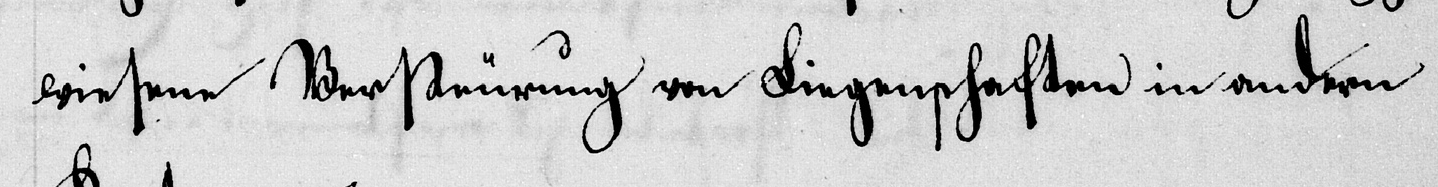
wiesene Versteurung von Liegenschaften in andern
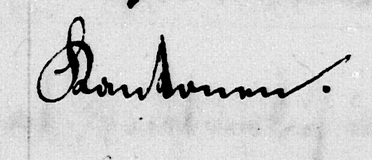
Kantonen.
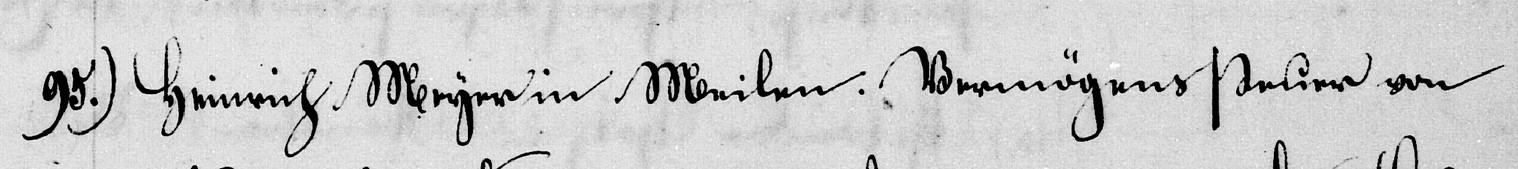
95.) Heinrich Meyer in Meilen. Vermögenssteuer von
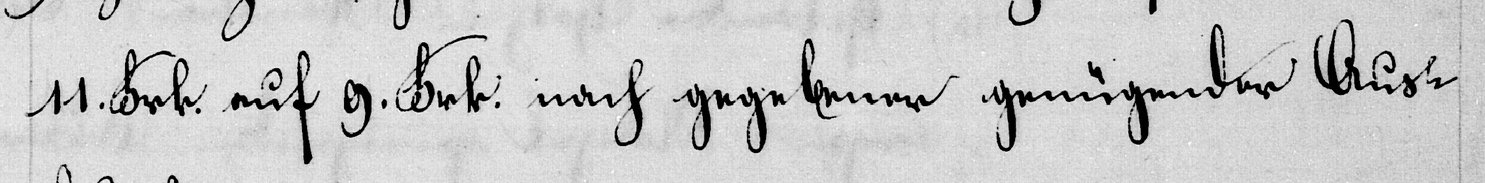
11. Frk. auf 9. Frk. nach gegebener genügender Aus¬
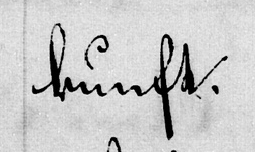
kunft.
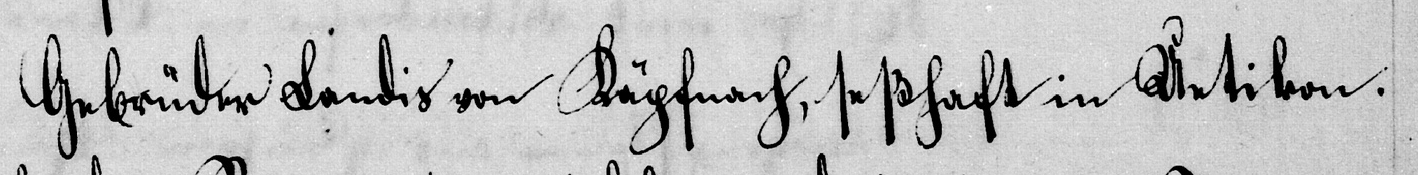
Gebrüder Landis von Käpfnach, seßhaft in Uetikon.
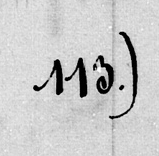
113.)
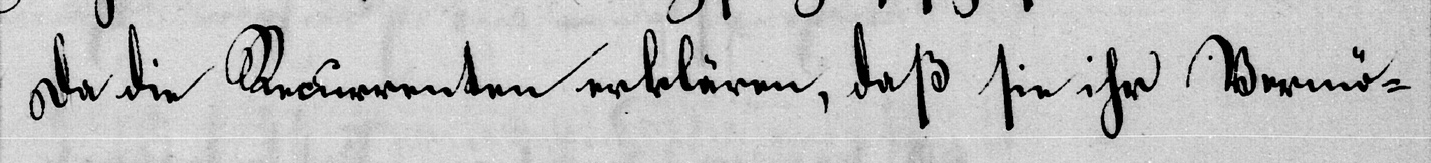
Da die Recurrenten erklären, daß sie ihr Vermö-
